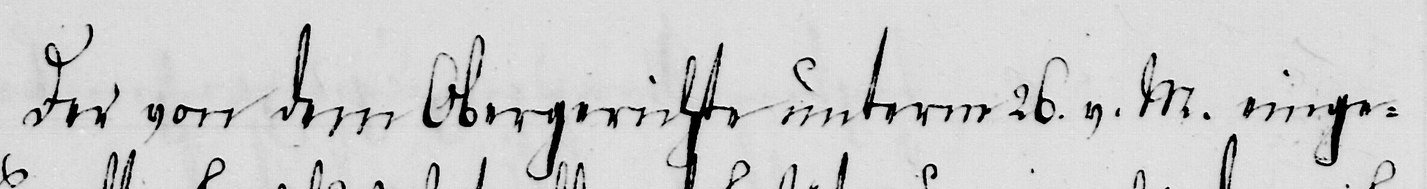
Der von dem Obergerichte unterm 26. v. M. einge¬
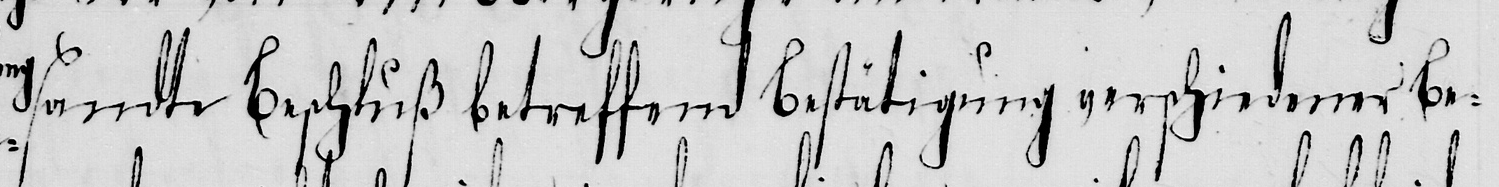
sandte Beschluß betreffend Bestätigung verschiedener Be¬
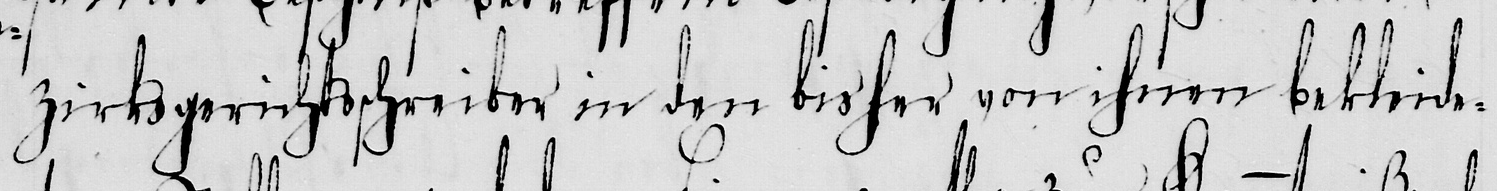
zirksgerichtsschreiber in den bisher von ihnen bekleide¬
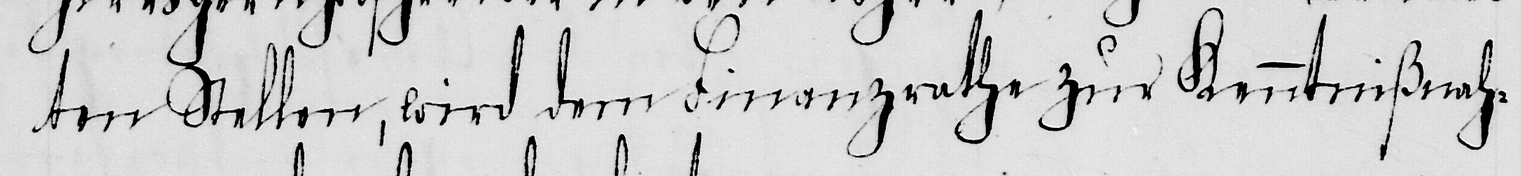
ten Stellen, wird dem Finanzrathe zur Kenntnißnah¬
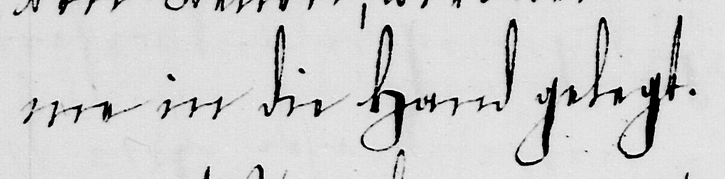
me in die Hand gelegt.
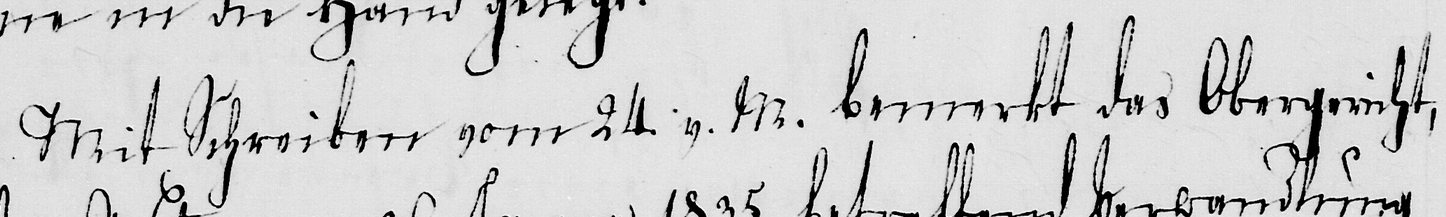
Mit Schreiben vom 24. v. M. bemerkt das Obergericht,
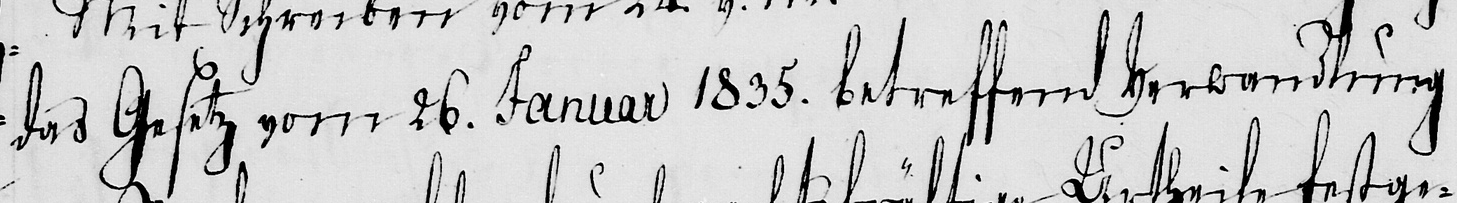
das Gesetz vom 26. Januar 1835. betreffend Verwandlung
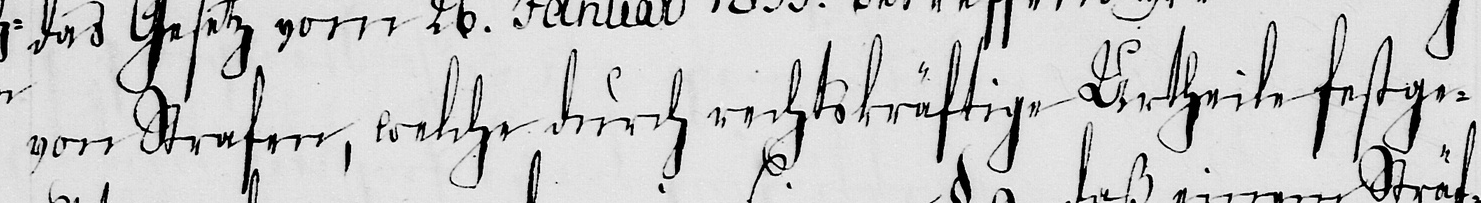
von Strafen, welche durch rechtskräftige Urtheile festge¬
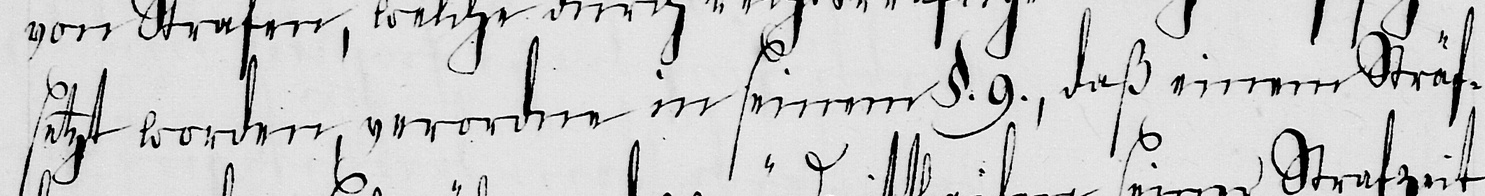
setzt worden, verordne in seinem §. 9., daß einem Sträf¬
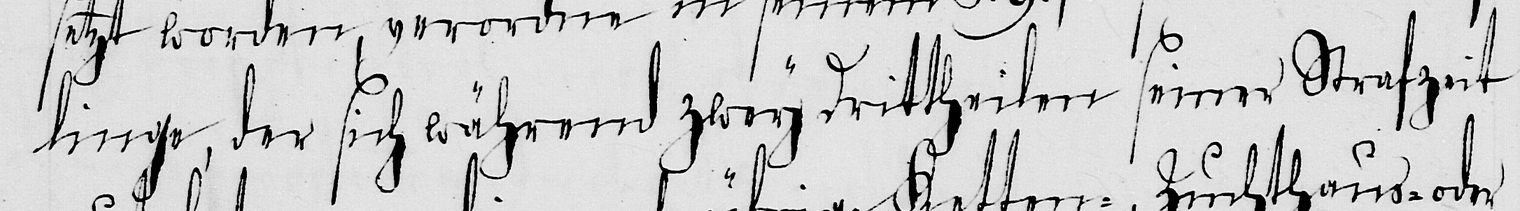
linge, der sich während zwey Drittheilen seiner Strafzeit
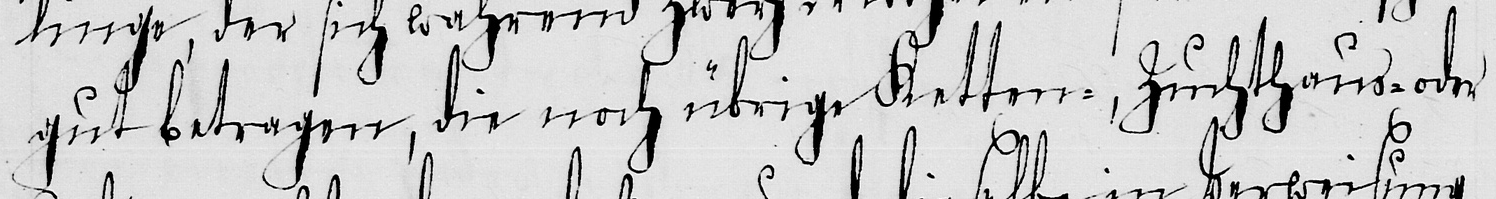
gut betragen, die noch übrige Ketten-, Zuchthaus- oder
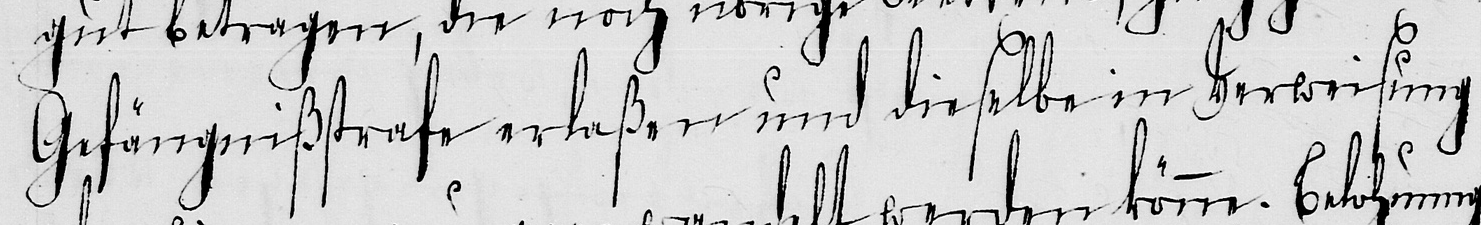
Gefängnißstrafe erlaßen und dieselbe in Verweisung
